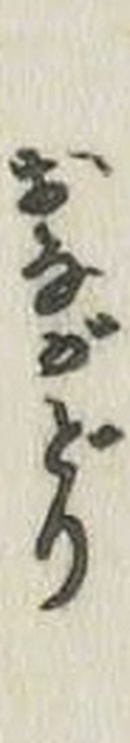おながどり
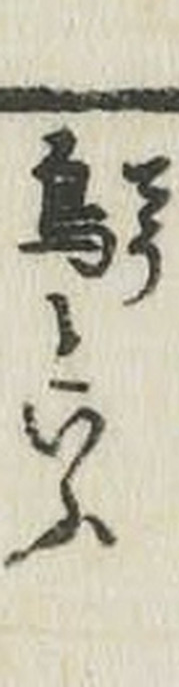鳥といふ
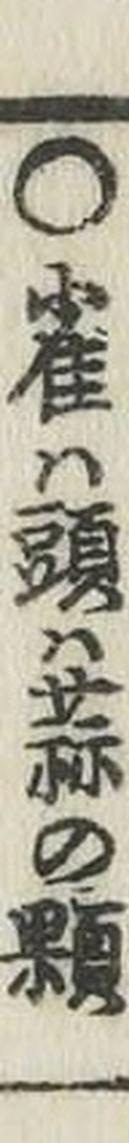○雀は頭は蒜の顆
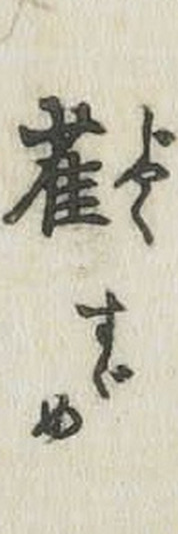雀すゞめ
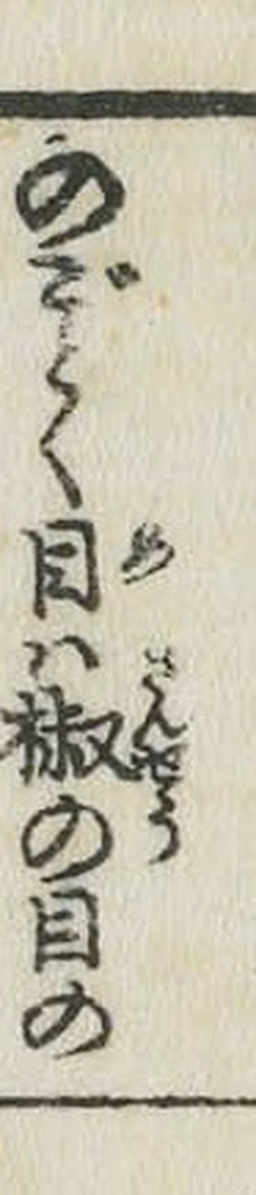のごとく目は椒の目の
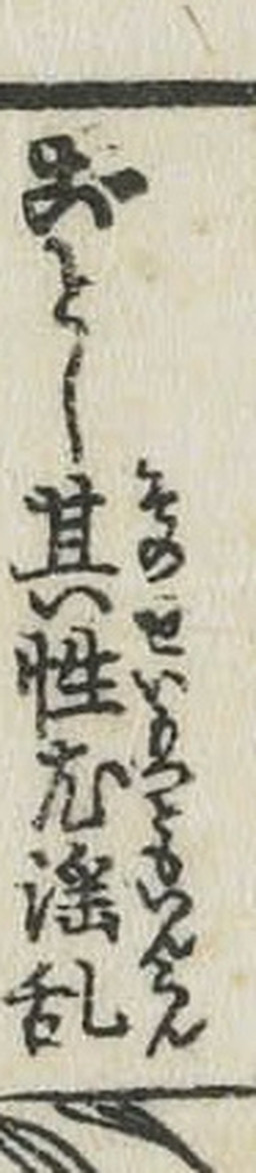ごとし其性尤淫乱
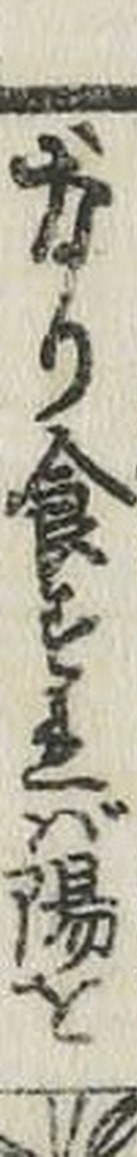なり食すれば陽を
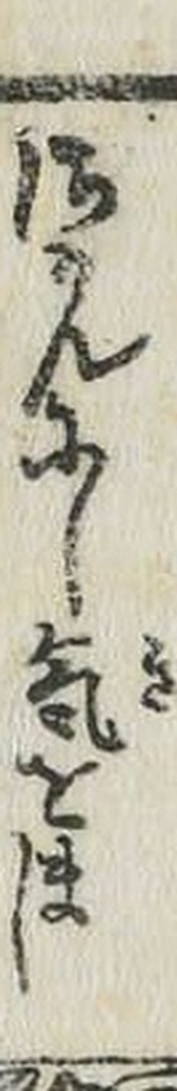さかんにし気をまし
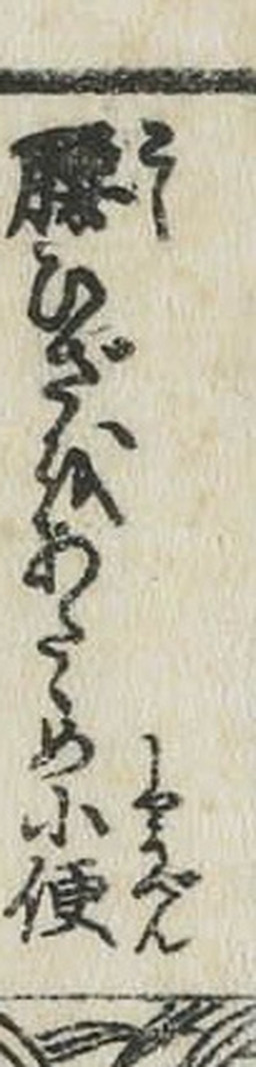腰ひざをあたゝめ小便
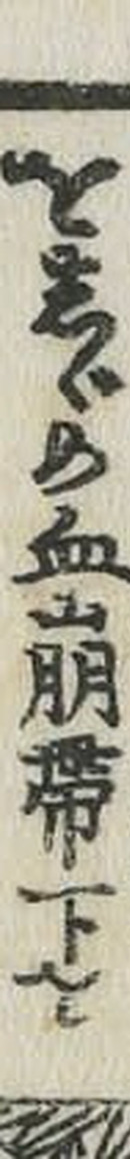をしゞめ血崩帯下を
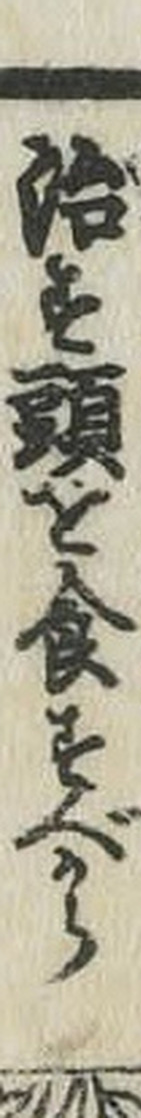治す頭を食すべから
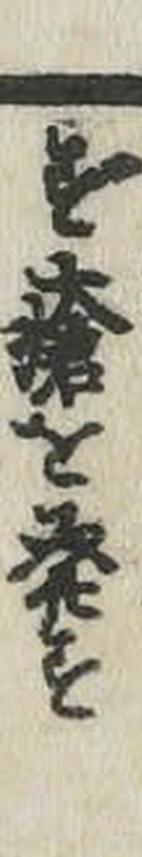ず瘡を発す

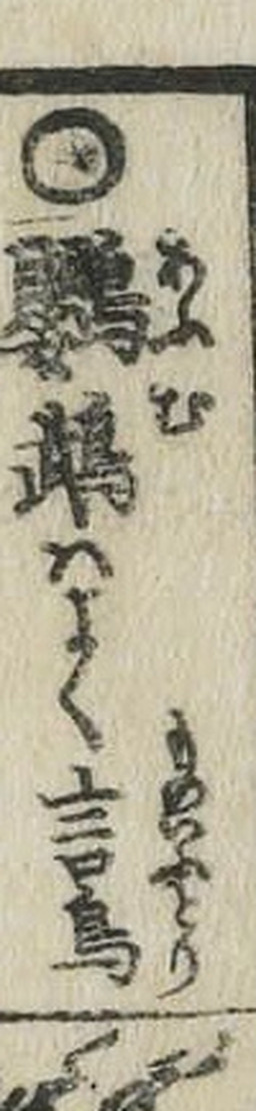○鸚鵡はよく言鳥
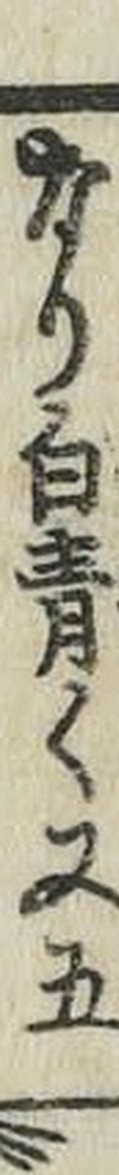なり白青く又五
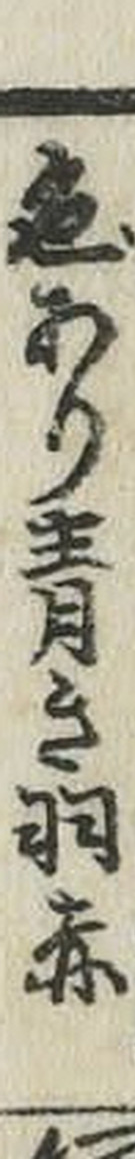色あり青き羽赤
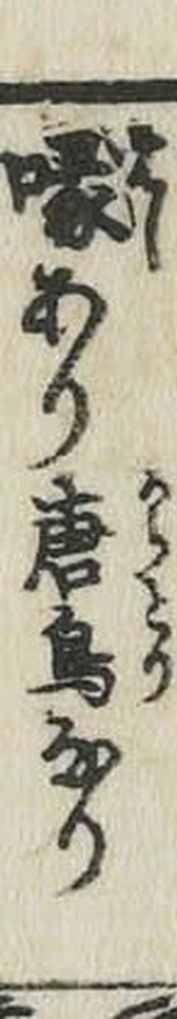喙あり唐鳥なり
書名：増補頭書訓蒙図彙大成 10巻 6:巻之12-13
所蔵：東京学芸大学教育コンテンツアーカイブ
